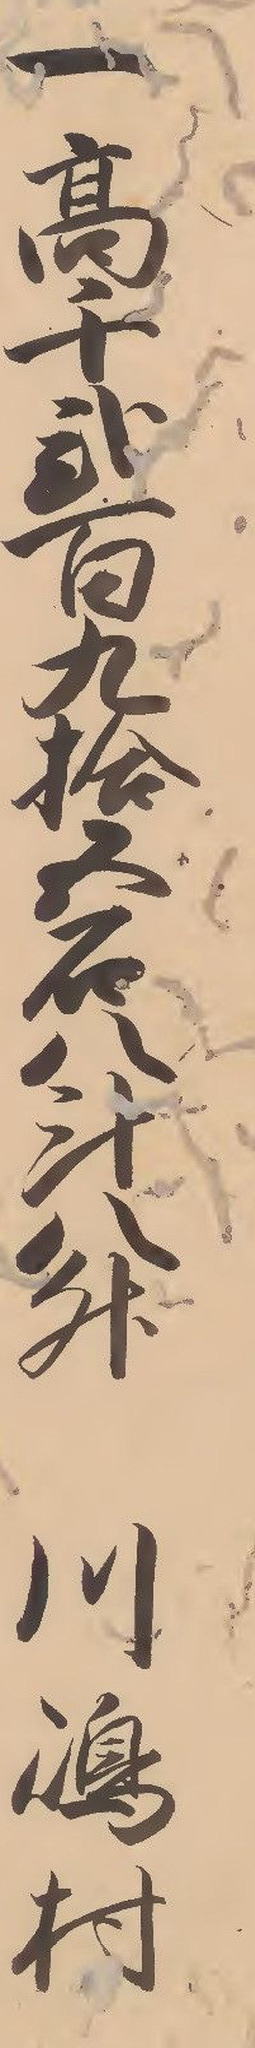一高千弐百九拾五石八斗八升川嶋村
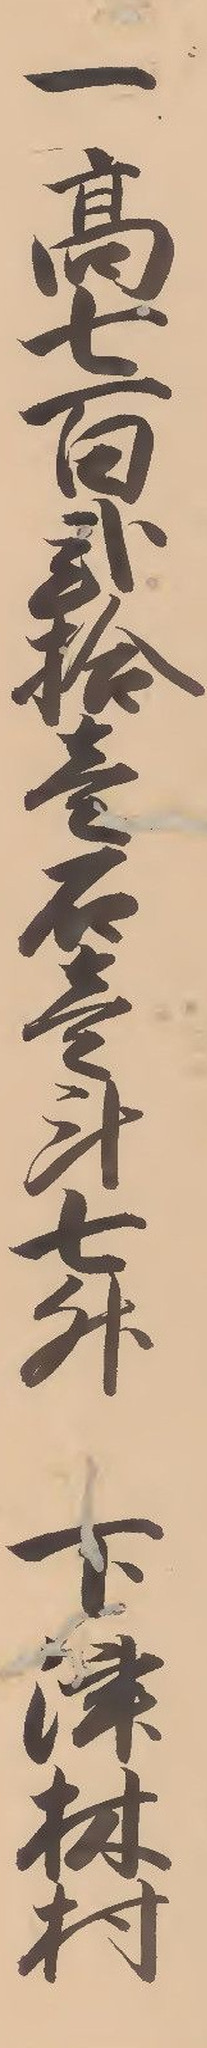一高七百弐拾壱石壱斗七升下津林村
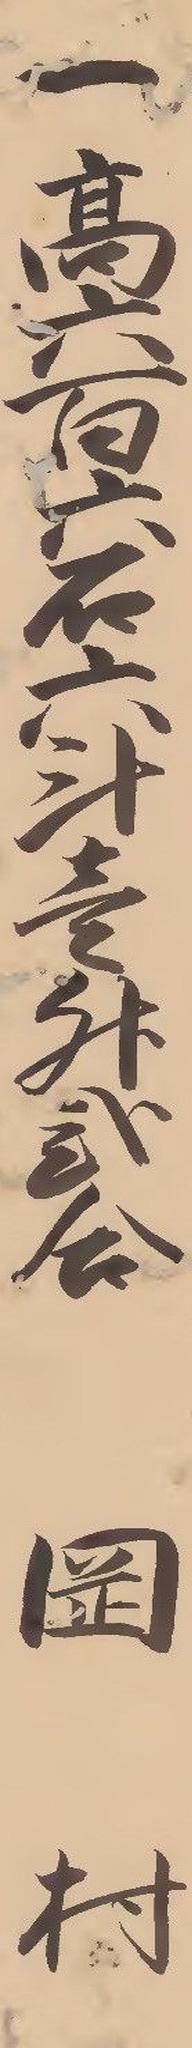一高六百六石六斗壱升弐合岡村
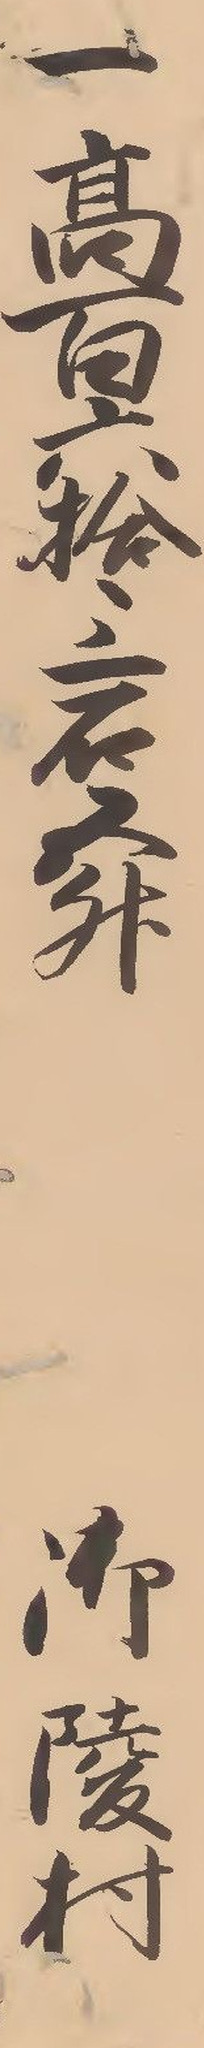一高百六拾三石五升御陵村

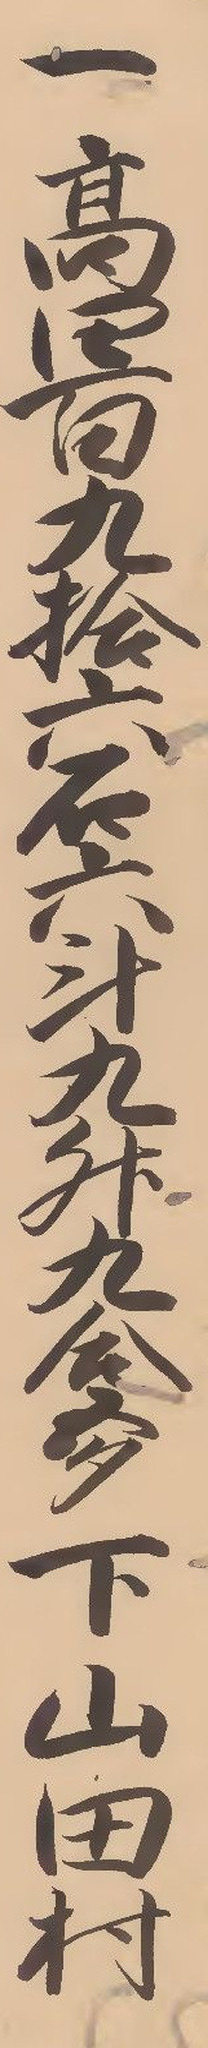一高四百九拾六石六斗九升九合五勺下山田村
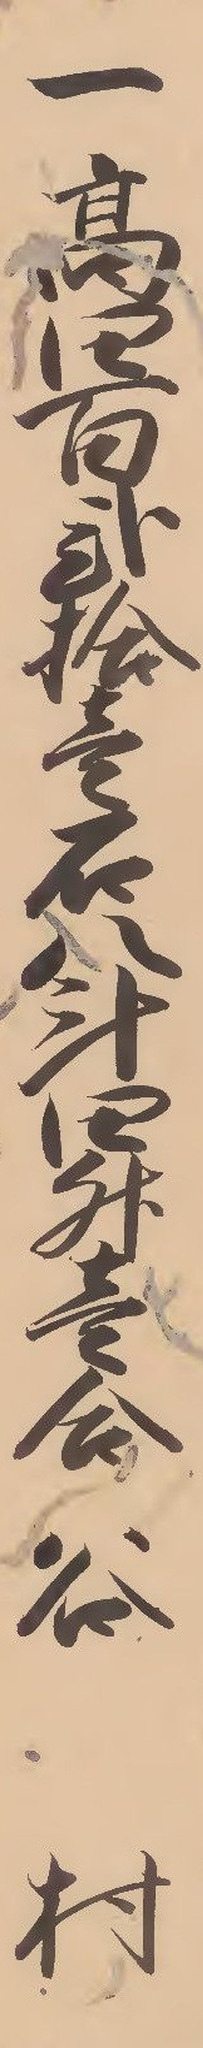一高四百弐拾壱石八斗四升壱合谷村
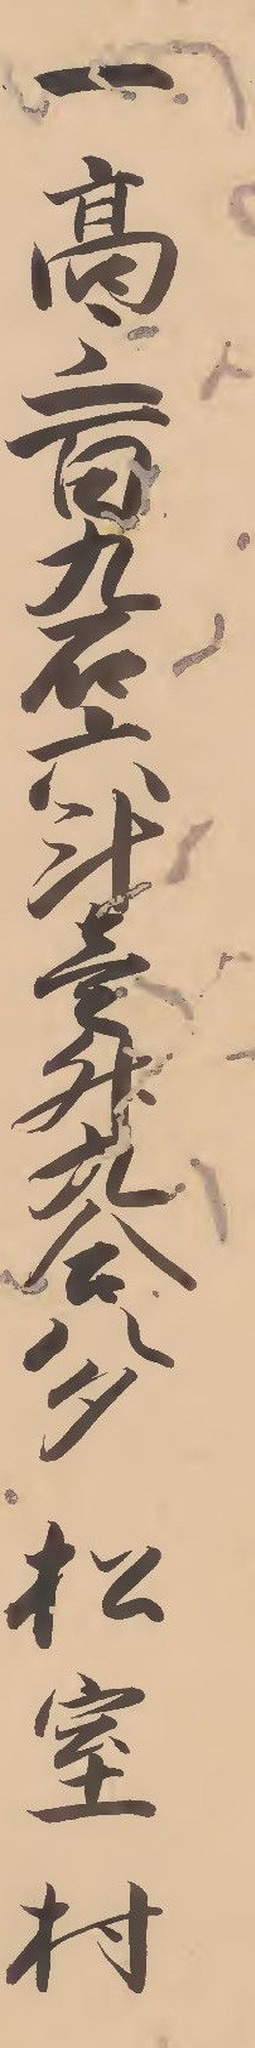一高三百九石六斗壱升九合八勺松室村
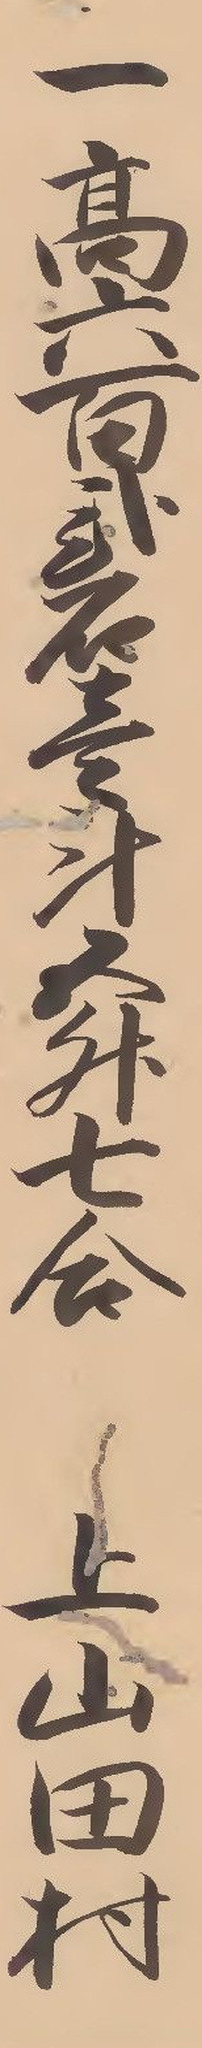一高六百弐石壱斗五升七合上山田村
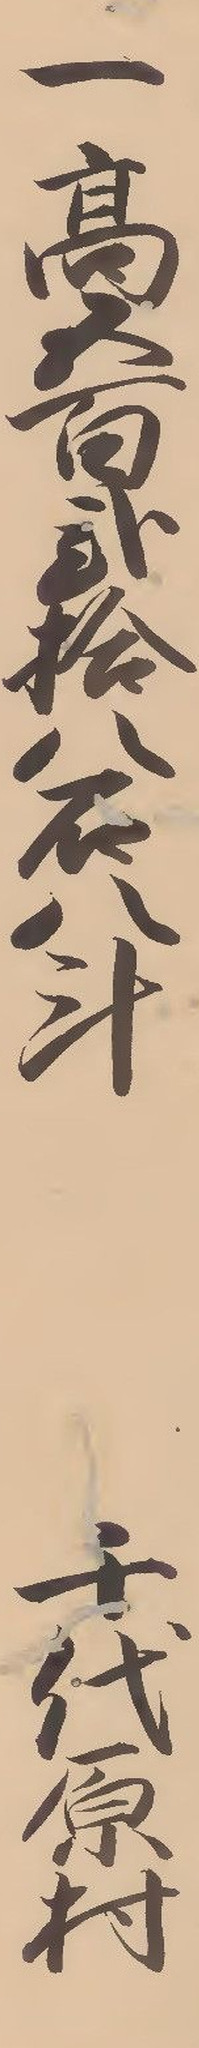一高五百弐拾八石八斗千代原村
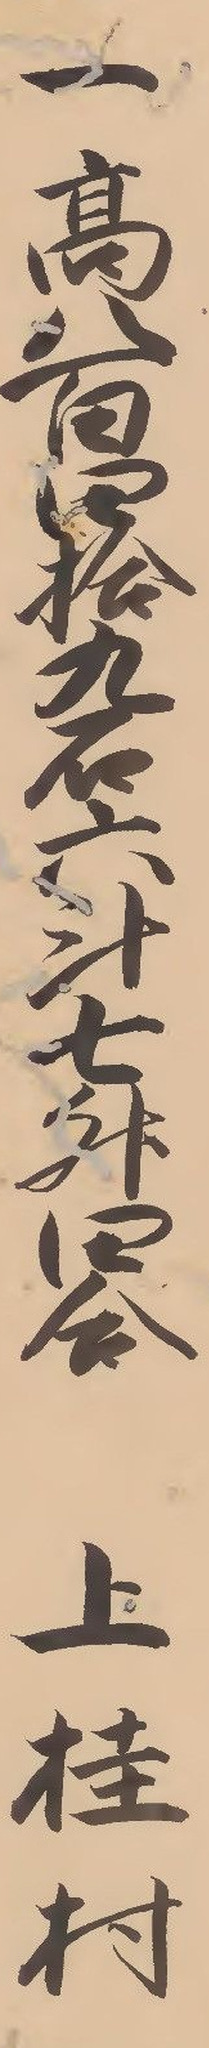一高八百四拾九石六斗七升四合上桂村
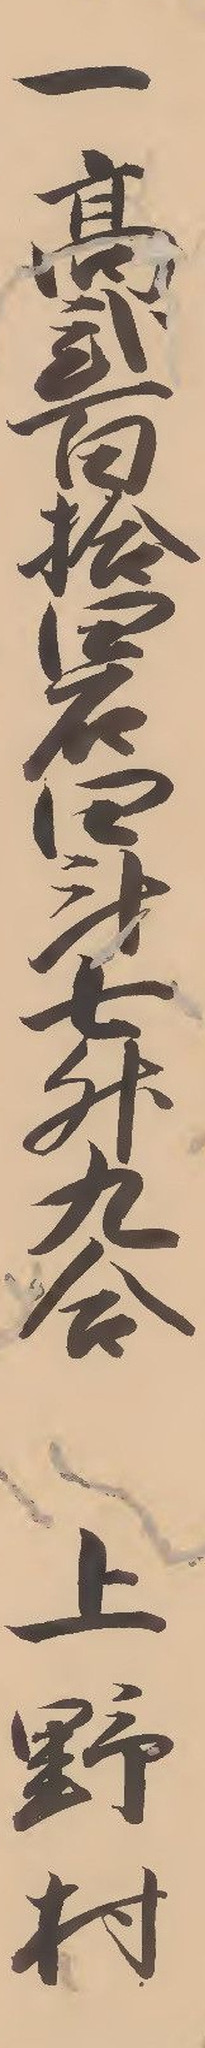一高弐百拾四石四斗七升九合上野村
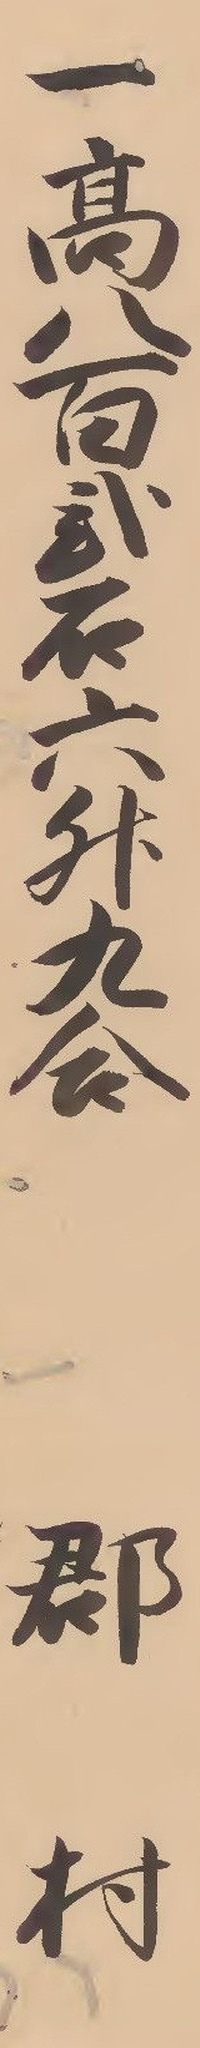一高八百弐石六升九合郡村

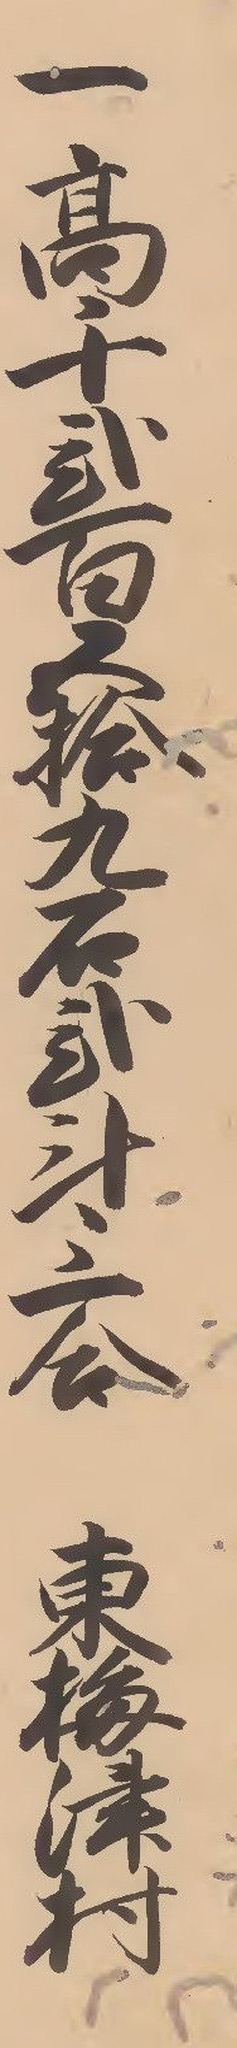一高千弐百五拾九石弐斗三合東梅津村
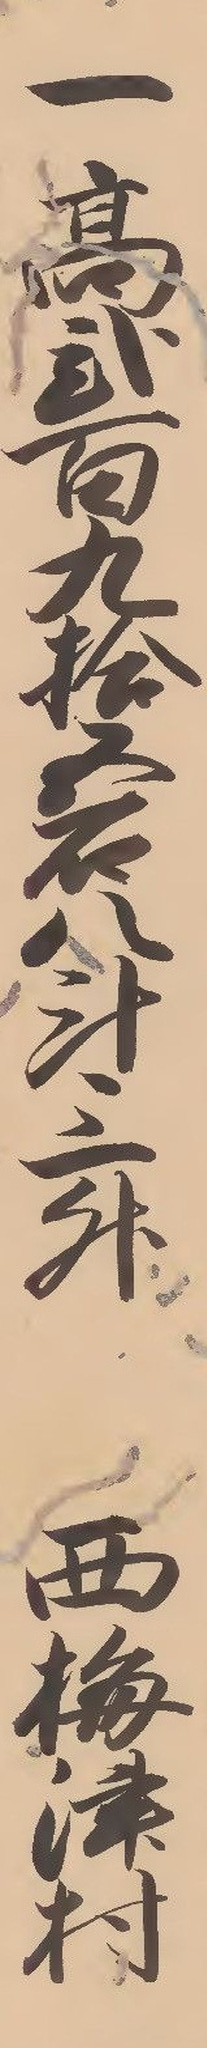一高弐百九拾五石八斗三升西梅津村
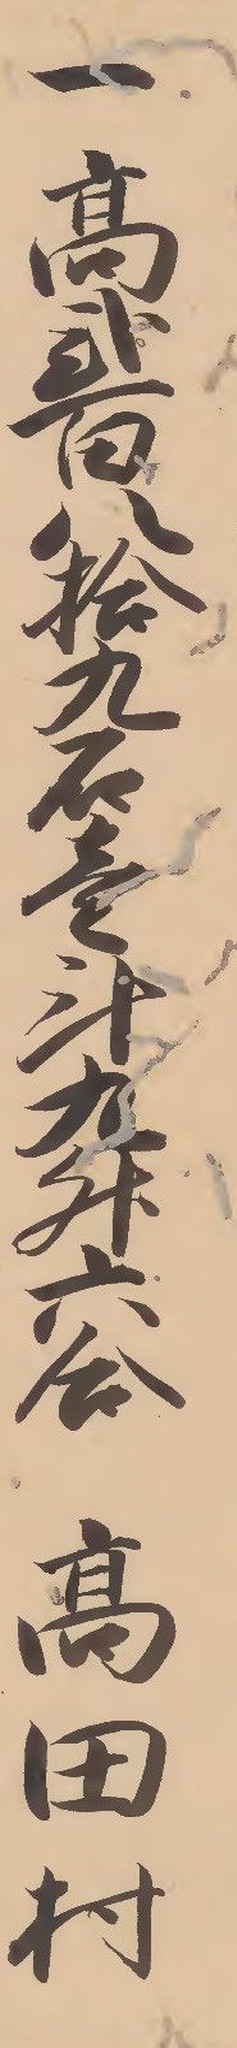一高弐百八拾九石壱斗九升六合高田村
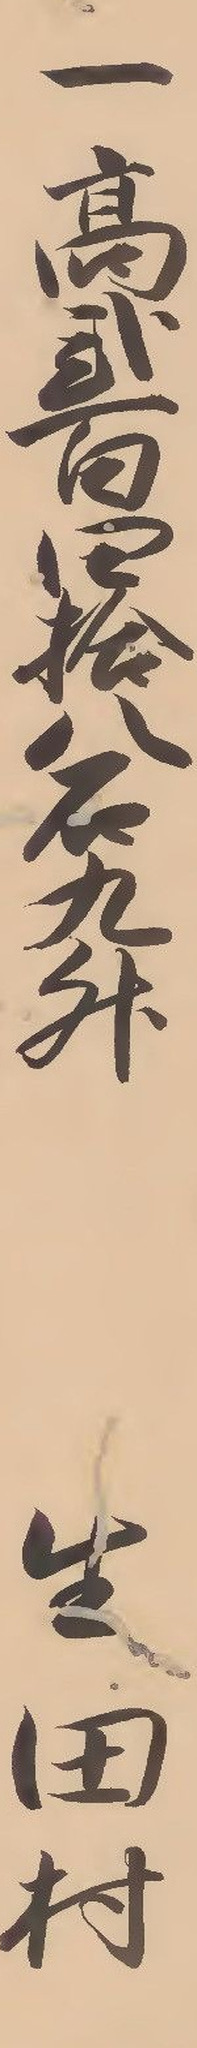一高弐百四拾八石九升生田村
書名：山城国郷帳
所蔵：国立公文書館 National Archives of Japan
